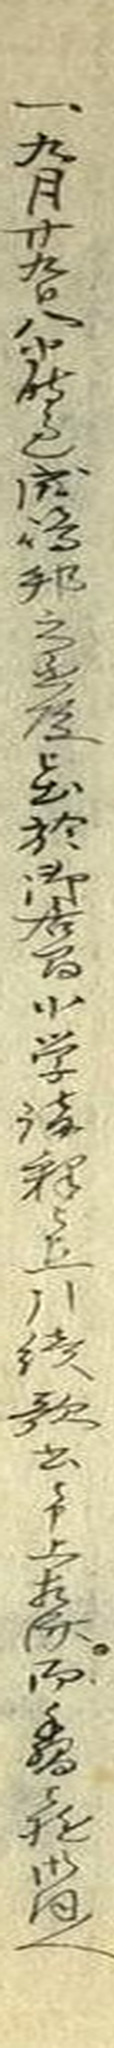一九月廿九日八半時過成嶋邦之丞殿被出於御居間小学講釈被申上引続歌書被申上相済御手習被遊御同人
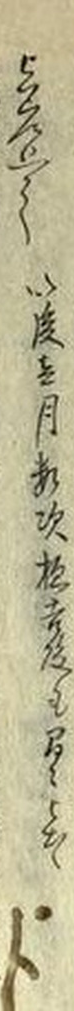被差上之以後壱月数次桓吉殿も間ニ被出候
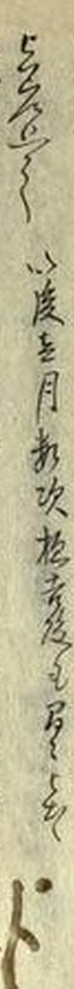被差上之以後壱月数次桓吉殿も間ニ被出候
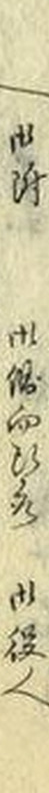御附御側向頭取御役人
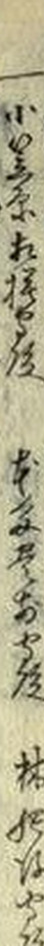小笠原相模守殿本多豊前守殿林肥後守殿
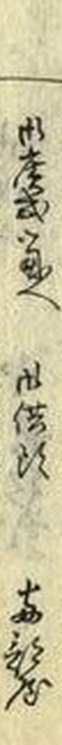御広式御用人御供頭両部屋
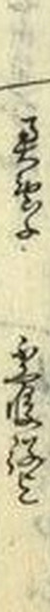奥台子不寝役迄
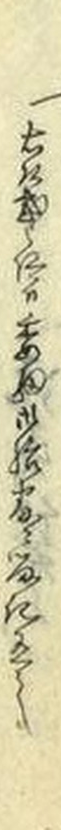右頂戴被仰付委細御膳番ニ留記有之
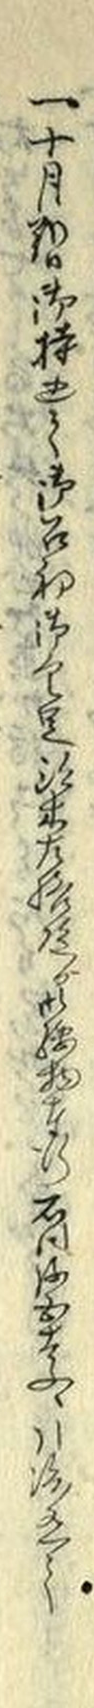一十月朔日御持込之御召初御具足鈴木左膳殿ゟ御腰物奉行石田弥五太夫へ引渡有之
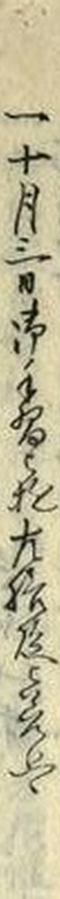一十月三日御手習被遊左膳殿被差上候
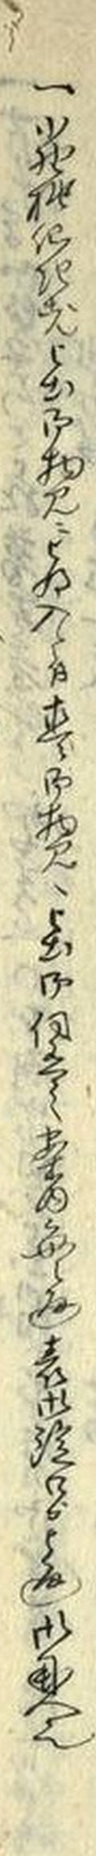一小野桃仙院老被出御物見ニ被為入候ニ付直ニ御物見へ被出御伺有之案内毎之通表御錠口ゟ被通御用人也
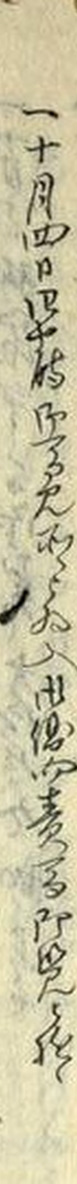一十月四日四半時御馬見所へ被為入御側向責馬御覧被遊候
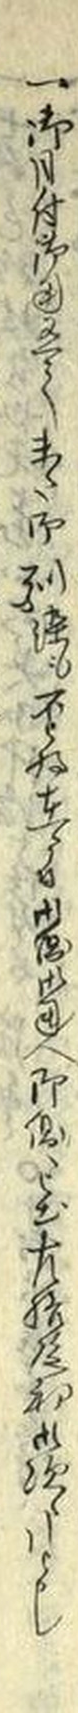一御目付御用有之未た御馴染も不被為在候ニ付御側御用人御側へ被出左膳殿初御次へ引被申候
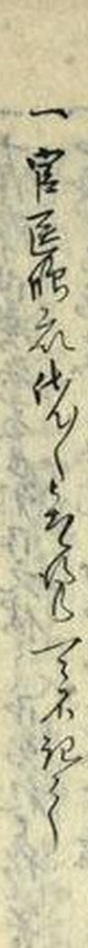一官医師衆代ル〳〵被出候得共一々不記之
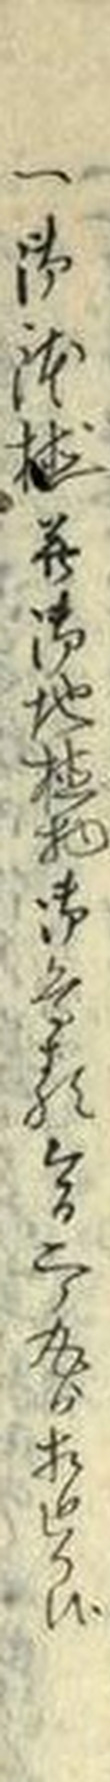一御鉢植幷御地植物御鳥類今日二ノ丸ゟ相廻り候
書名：少傅日録抄（斉善付側向頭取日記、在府）
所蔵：福井県文書館 Fukui Prefectural Archives
